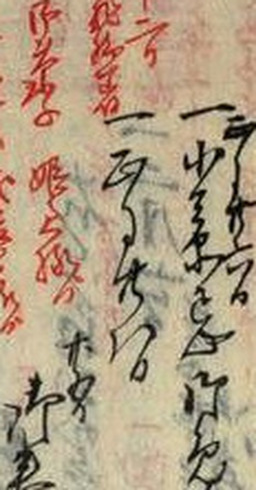一正月廿日
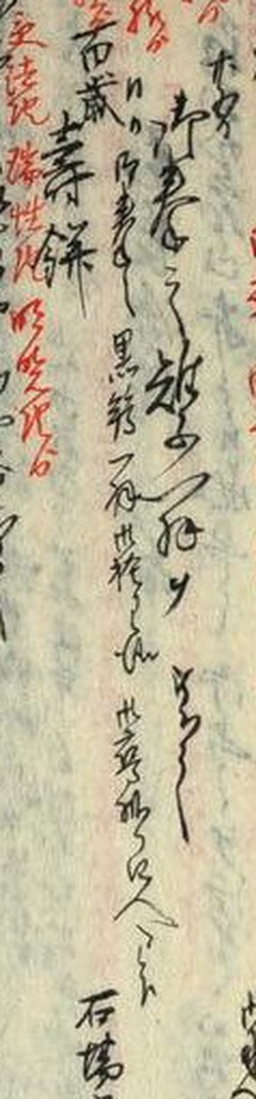同日御拳之黒鵇一羽御捨り之趣御鷹掛り四人へ被下
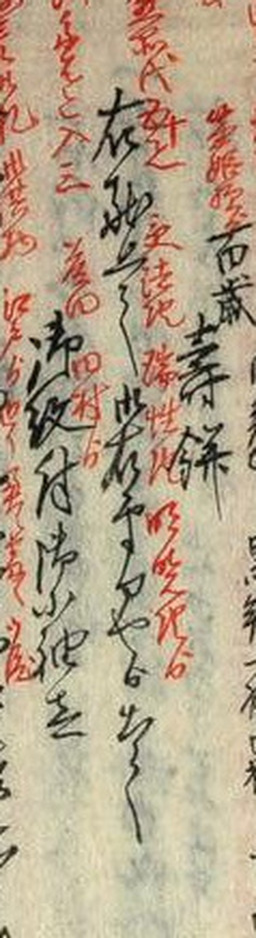右献上之御右筆部やゟ出之
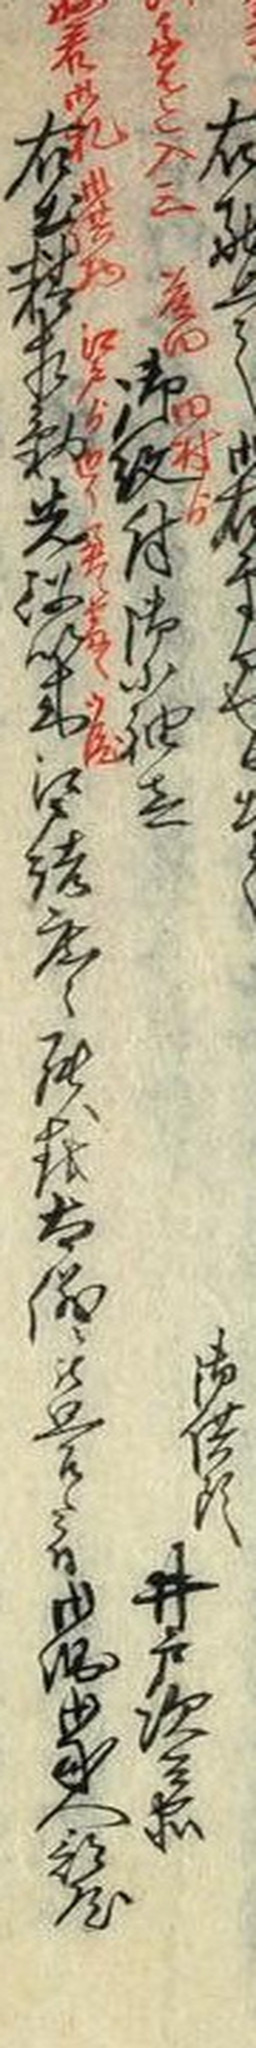右出精相勤先役以来江戸詰度々罷越太儀ニ被思召候ニ付御側御用人部屋
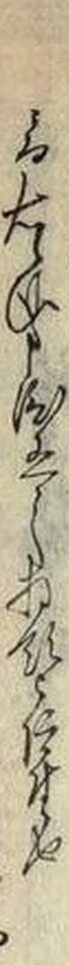ニ而右之趣申渡有之拝領被仰付候由
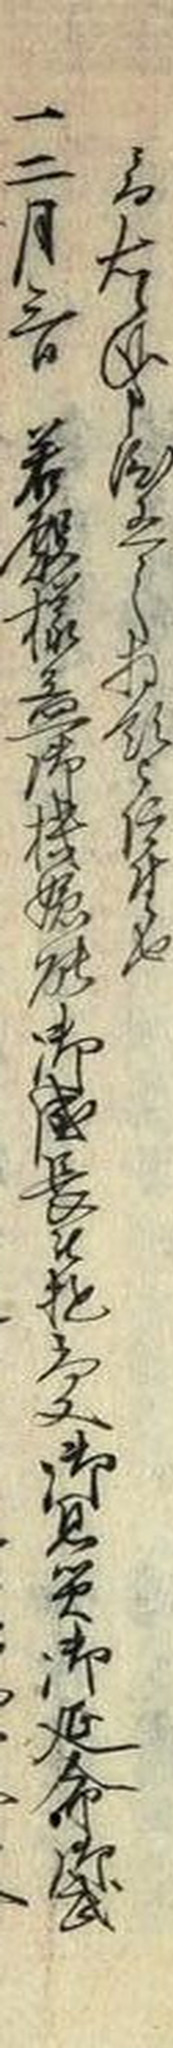一二月三日若殿様益御機嫌能御成長被遊尚又御息災御延朱書き命御武
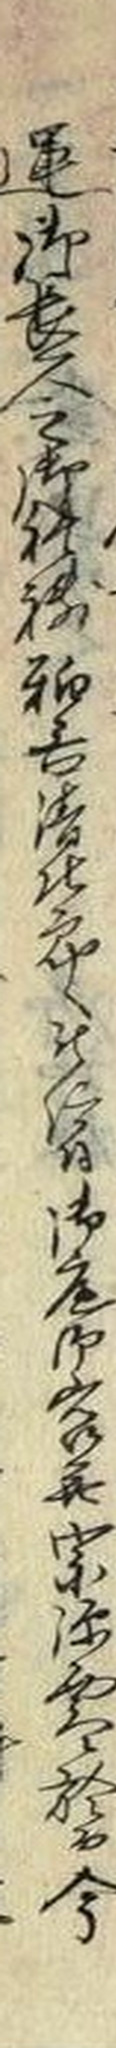運御長久之御祈祷粕谷清次郎へ被仰付御庭御宮幷崇源殿ニ於而今
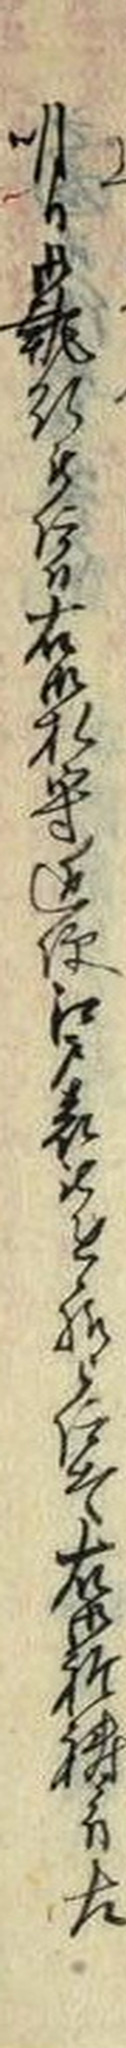明日御執行被仰付右御札守近便江戸表被進候様被仰出候右御祈禱ニ付左

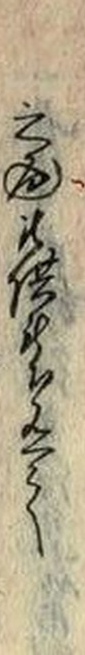之通被供被下有之
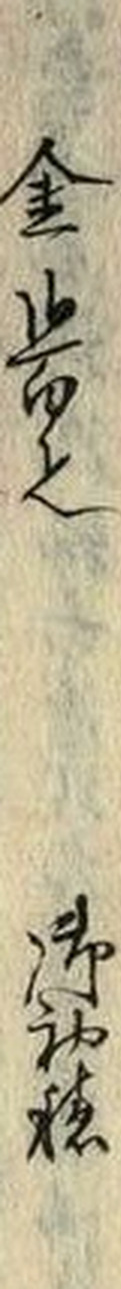金弐百疋御初穂
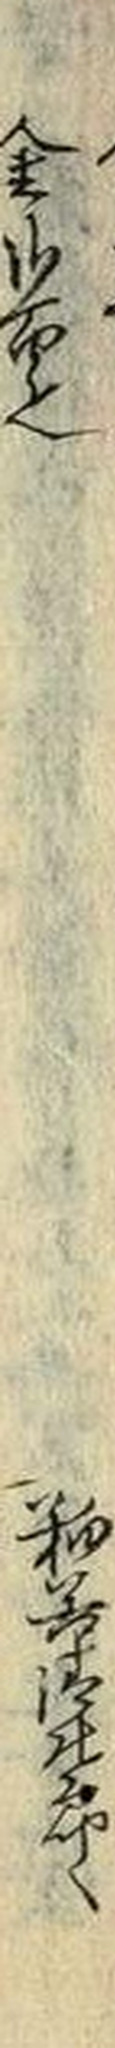金弐百疋粕谷清次郎へ
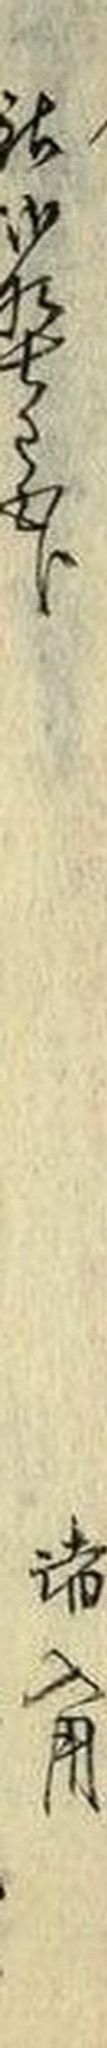銀弐拾七匁五分諸入用
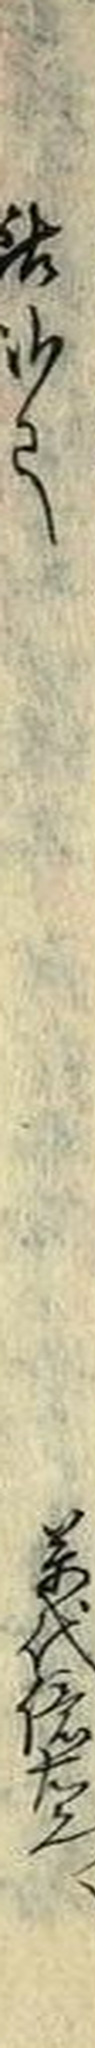銀弐匁万代億右衛門へ
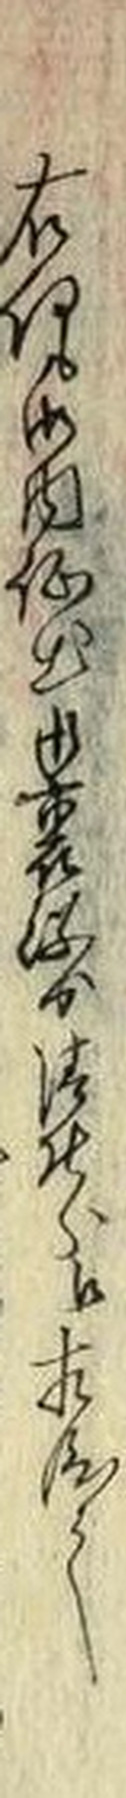右何も御内証出御裏役ゟ清次郎江相渡之
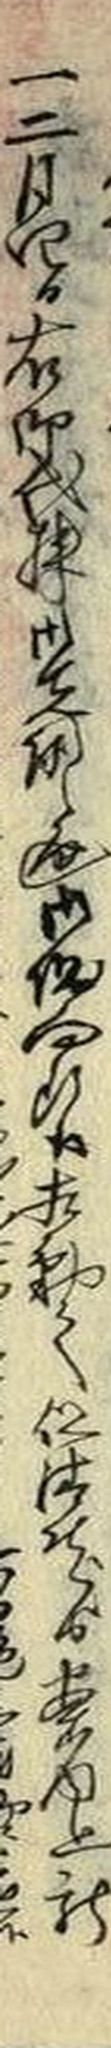一二月四日右御代拝御先例之通御側向頭取相勤之但清次郎ゟ案内上新
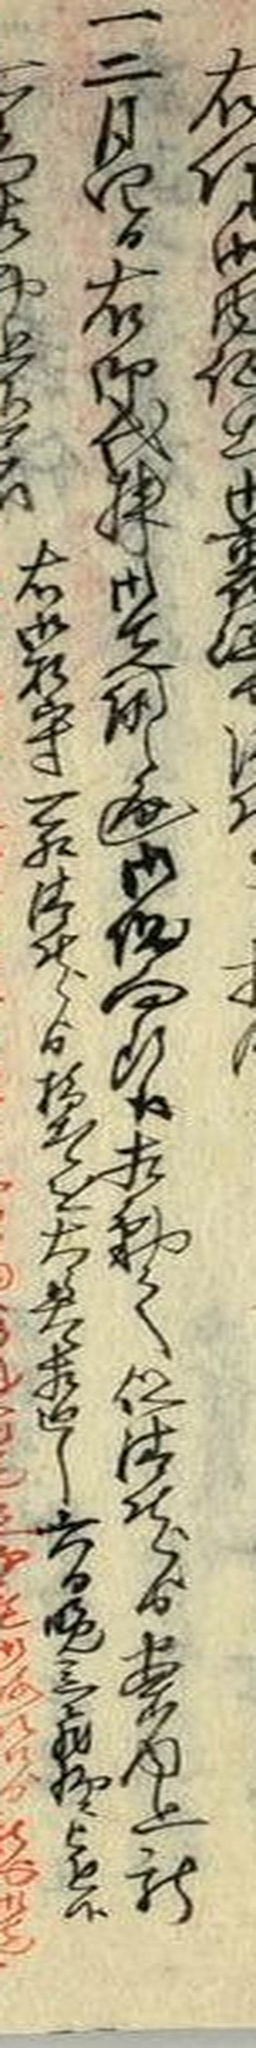右衛門相勤上下着右御札守一箱清次郎ゟ指出候を大奥へ相廻し六日晩立飛脚ニ被進候
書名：少傅日録抄（斉承付側向頭取日記、在国）
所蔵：福井県文書館 Fukui Prefectural Archives
